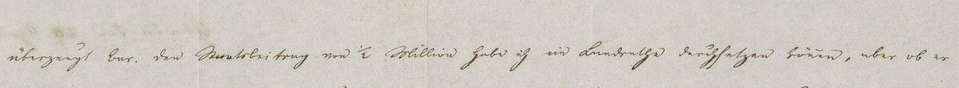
überzeugt war. Den Staatsbeitrag von ½ Million habe ich im Landrathe durchsetzen können, aber ob es
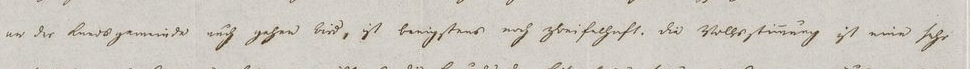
an der Landsgemeinde auch gehen wird, ist wenigstens noch zweifelhaft. Die Volksstimmung ist eine sehr
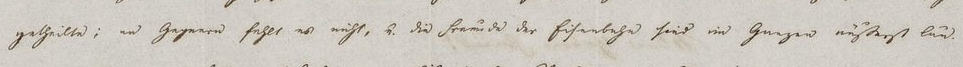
getheilte; an Gegnern fehlt es nicht, u. die Freunde der Eisenbahn sind im Ganzen äußerst lau.
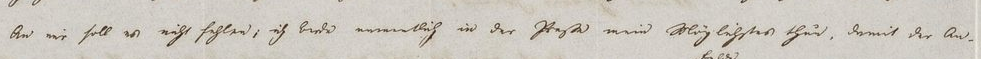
An mir soll es nicht fehlen; ich werde namentlich in der Preße mein Möglichstes thun, damit der An-
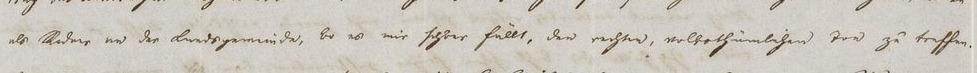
als Redner an der Landsgemeinde, wo es mir schwer fällt, den rechten, volksthümlichen Ton zu treffen.
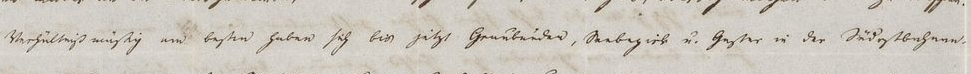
Verhältniß mäßig am besten haben sich bis jetzt Graubünden, Seebezirk u. Gaster in der Südostbahnan-
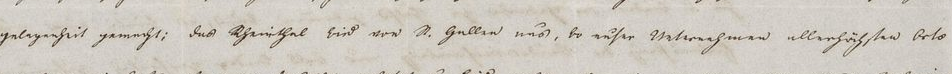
gelegenheit gemacht; das Rheinthal wird von St. Gallen aus, wo unser Unternehmen allerhöchsten Orts
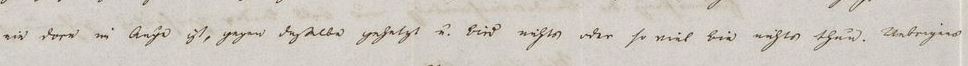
ein Dorn im Auge ist, gegen daßelbe gehetzt u. wird nichts oder so viel wie nichts thun. Uebrigens
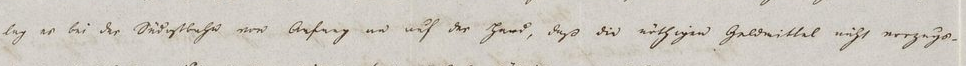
lag es bei der Südostbahn von Anfang an auf der Hand, daß die nöthigen Geldmittel nicht vorzugs-
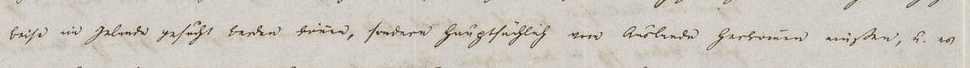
weise im Inlande gesucht werden können, sondern hauptsächlich vom Auslande herkommen müßen, u. es
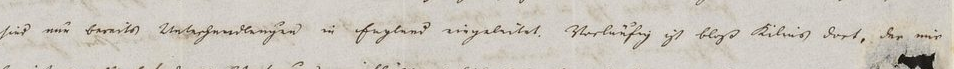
sind nun bereits Unterhandlungen in England eingeleitet. Vorläufig ist bloß Kilias dort, der mir
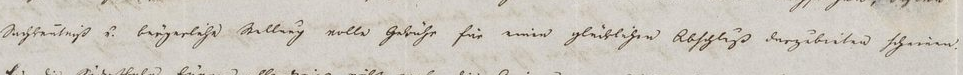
Sachkenntniß u. bürgerliche Stellung volle Gewähr für einen glücklichen Abschluß darzubieten scheinen.
